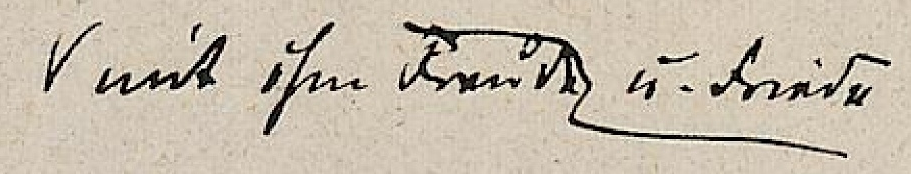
V mit ihm Freude u. Friede
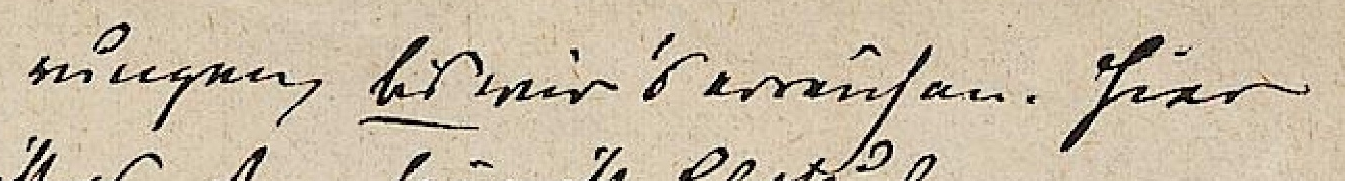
rungen, bis wir's erreichen. Hier
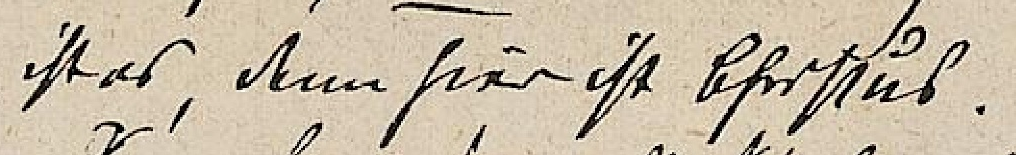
ist es, denn hier ist Christus.
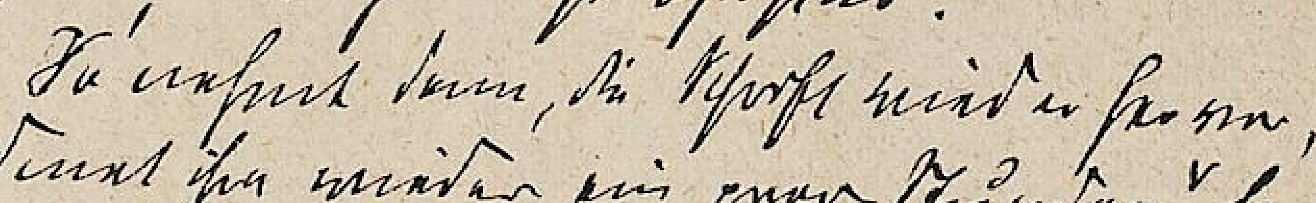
So nehmt denn die Schrift wieder hervor
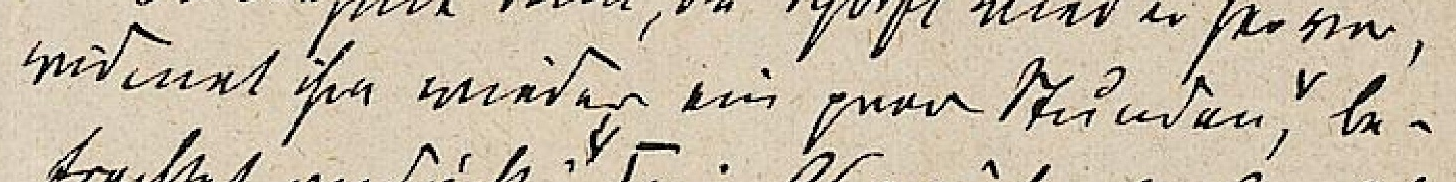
widmet ihr wieder ein paar Stunden, be¬
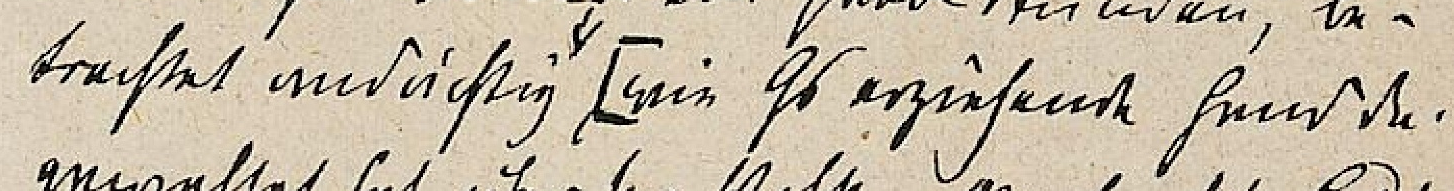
trachtet andächtig, [wie Gs erziehende Hand da
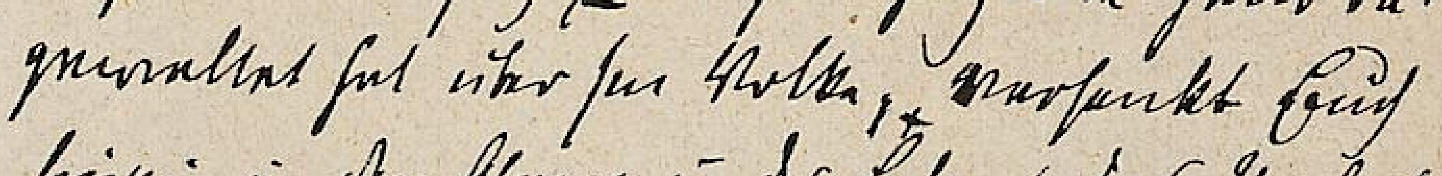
gewaltet hat über sm Volke, versenkt Euch
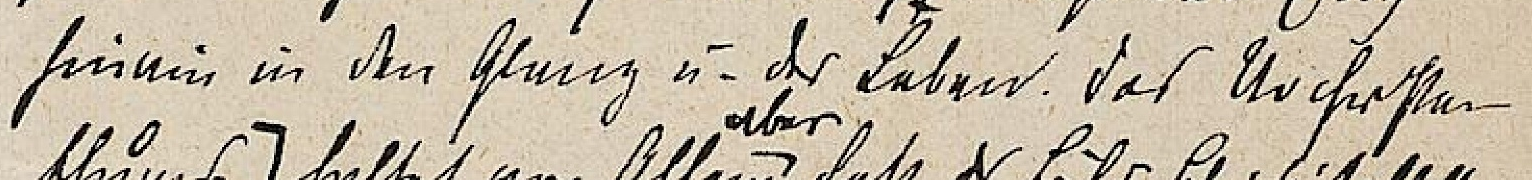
hinein in den Glanz u. des Leben. des Urchristen¬
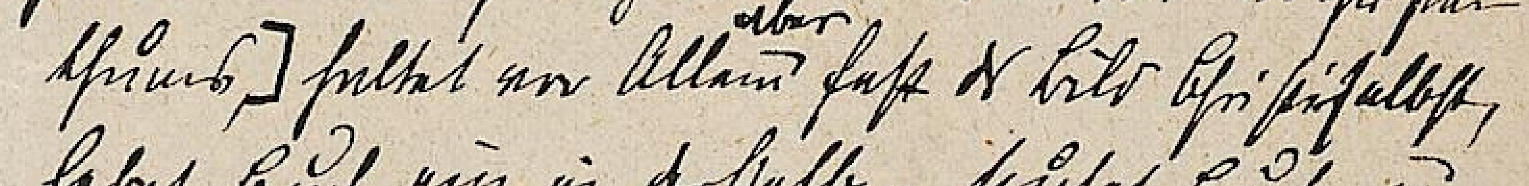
thums,] haltet vor Allem fest ds Bild Christi selbst,,
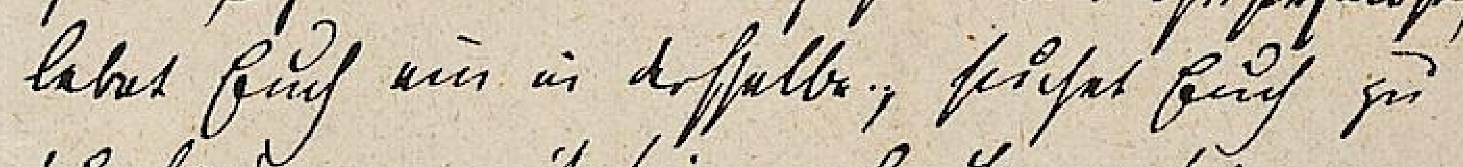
lebet Euch ein in dersselbe,. suchet Euch zu
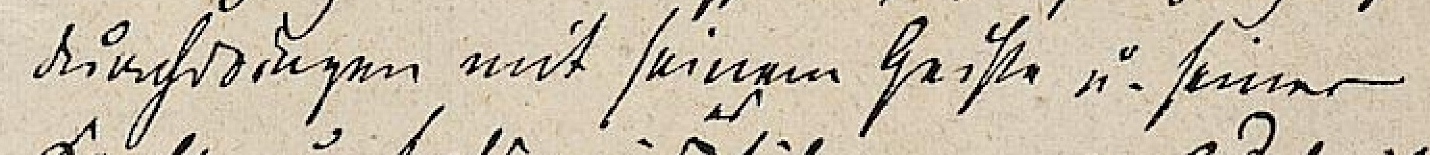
durchdringen mit seinem Geiste u. seiner
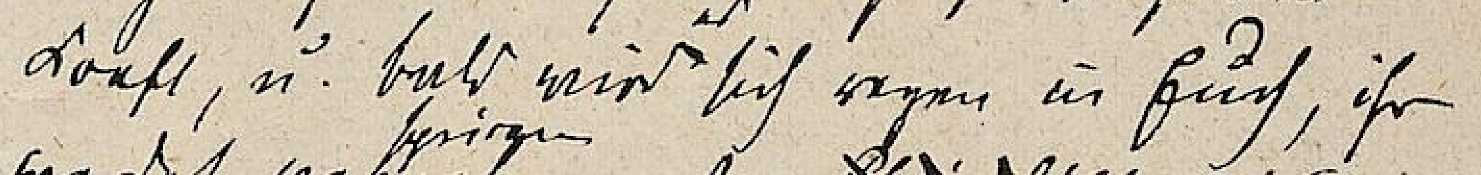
Kraft, u. bald wird sich regen in Euch, ihr
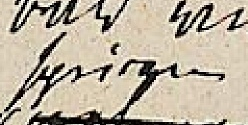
springen
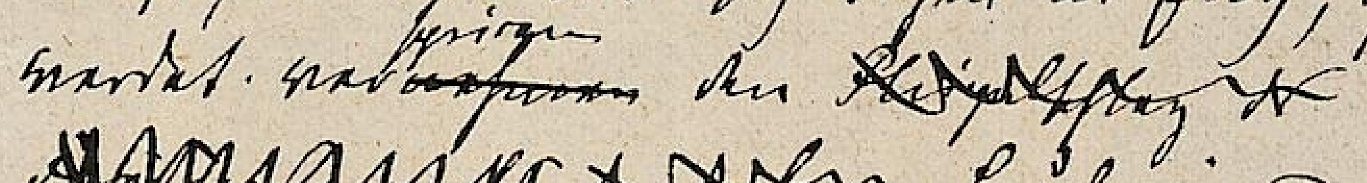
werdet vernehmen, den Plinpelschlag ds
